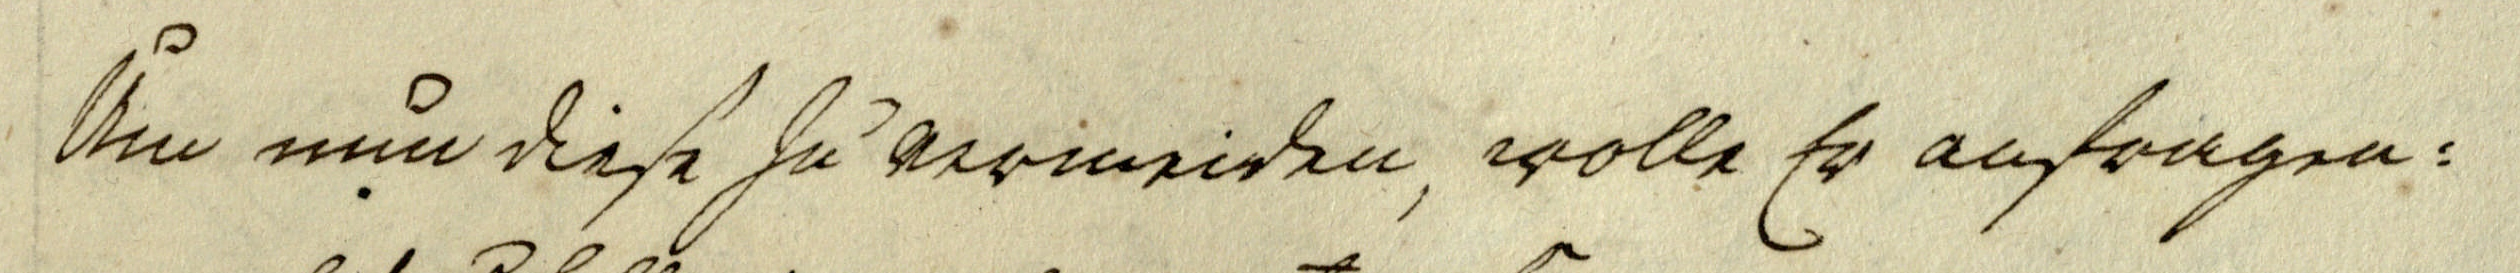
Um nun diese zu vermeiden, wolle Er anfragen:
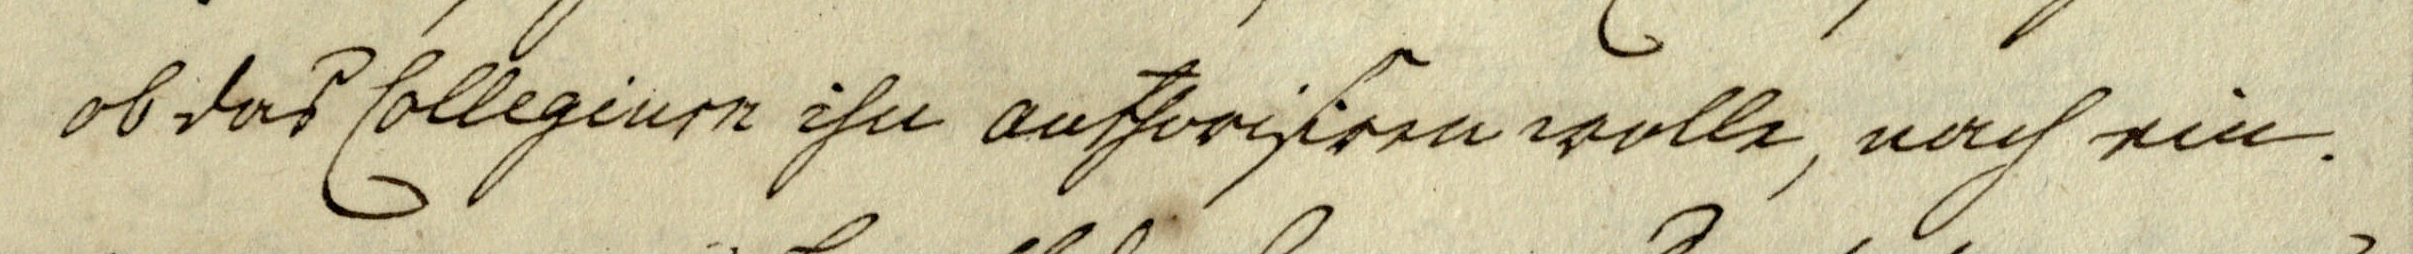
ob das Collegium ihn authorisiren wolle, nach ein¬
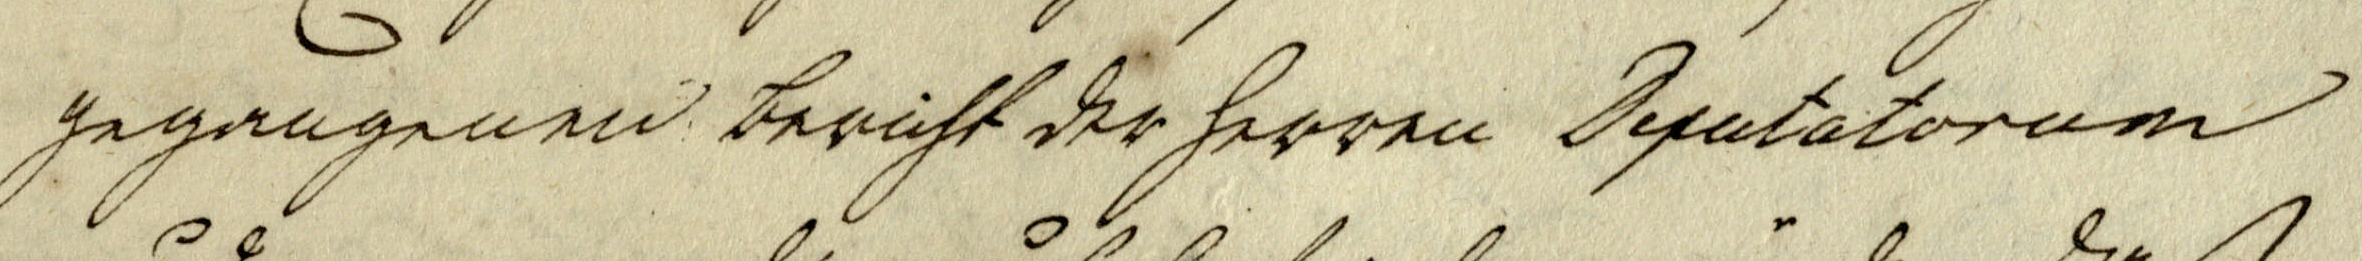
gegangenen Bericht der Herren Deputatorum
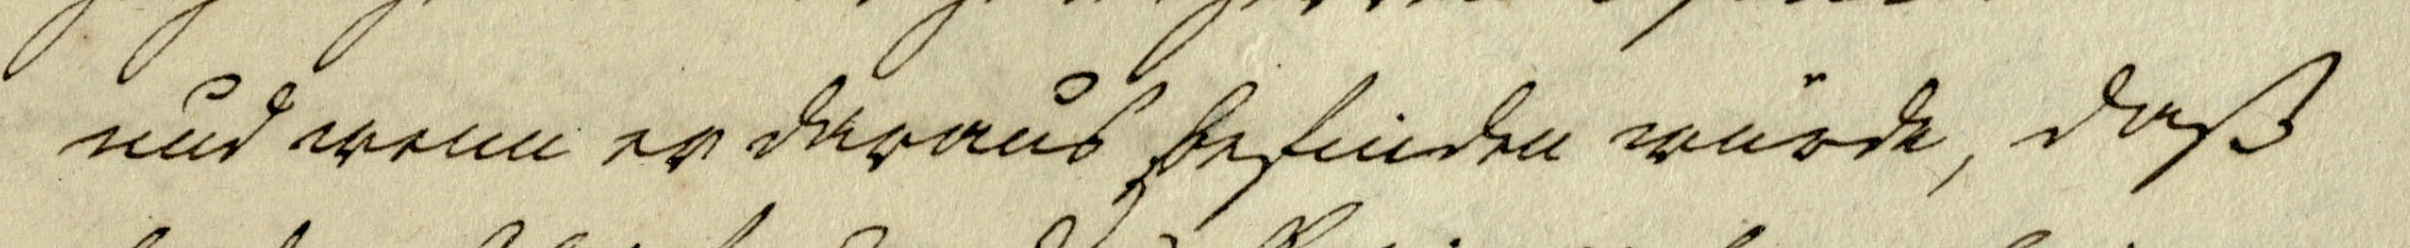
und wenn er daraus befinden würde, daß
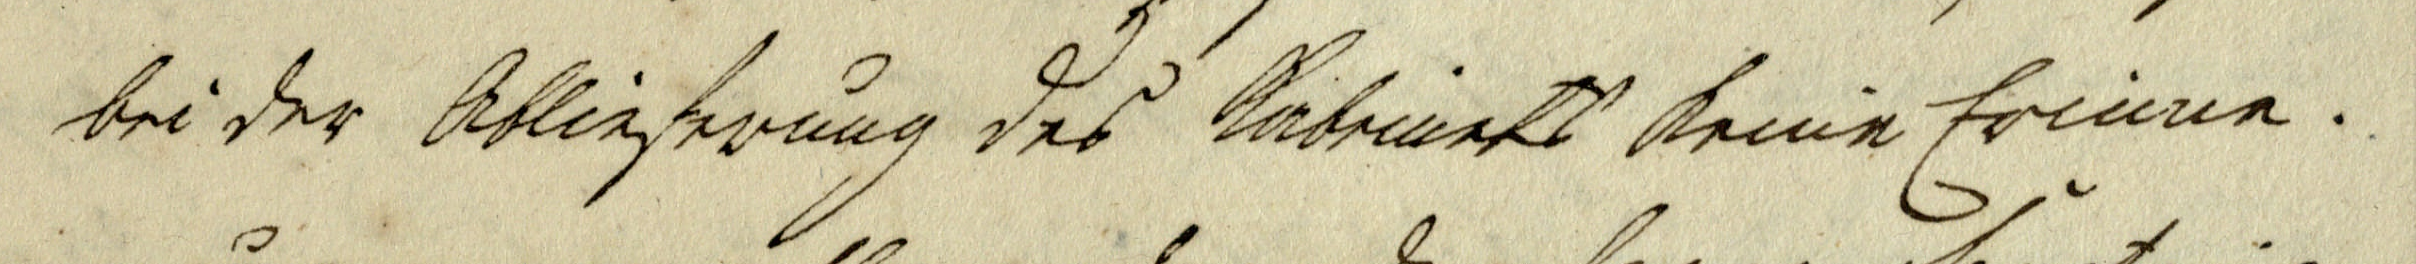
bei der Ablieferung des Kabinets keine Erinne¬
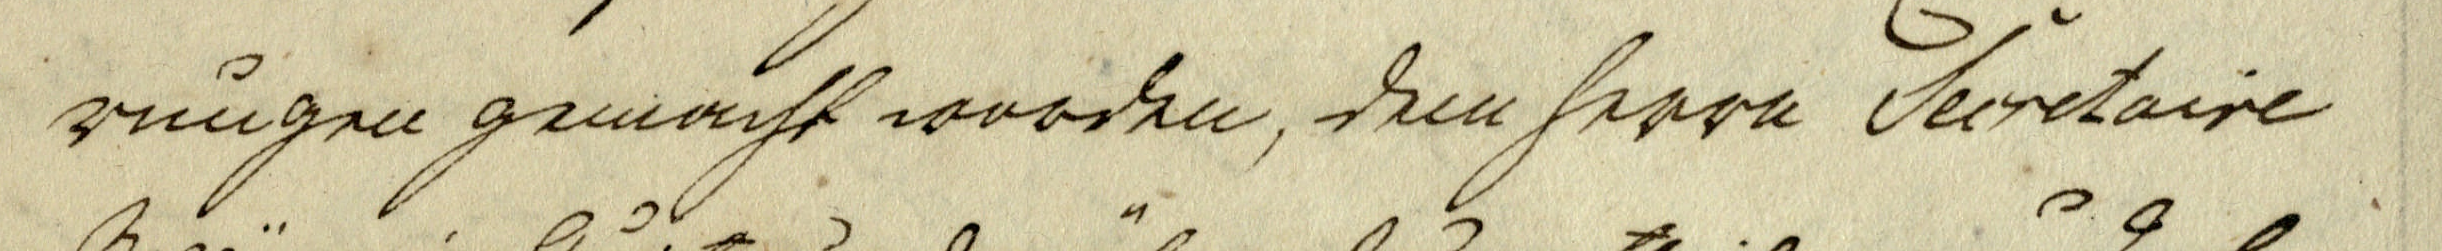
rungen gemacht worden, dem Herrn Secretaire
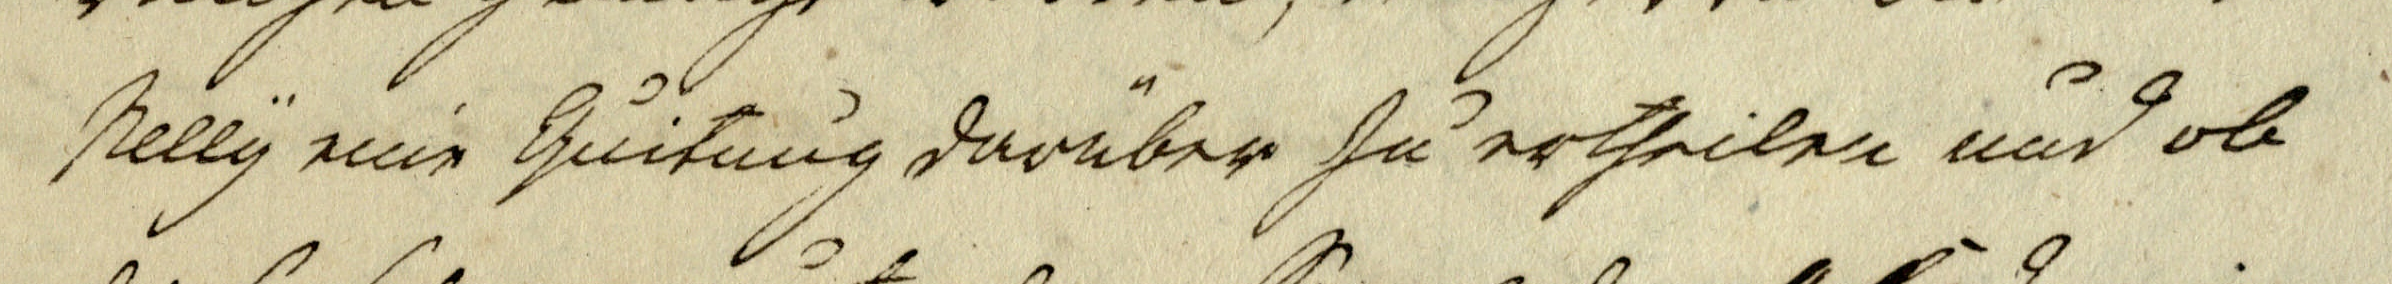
Nellÿ eine Quitung darüber zu ertheilen und ob
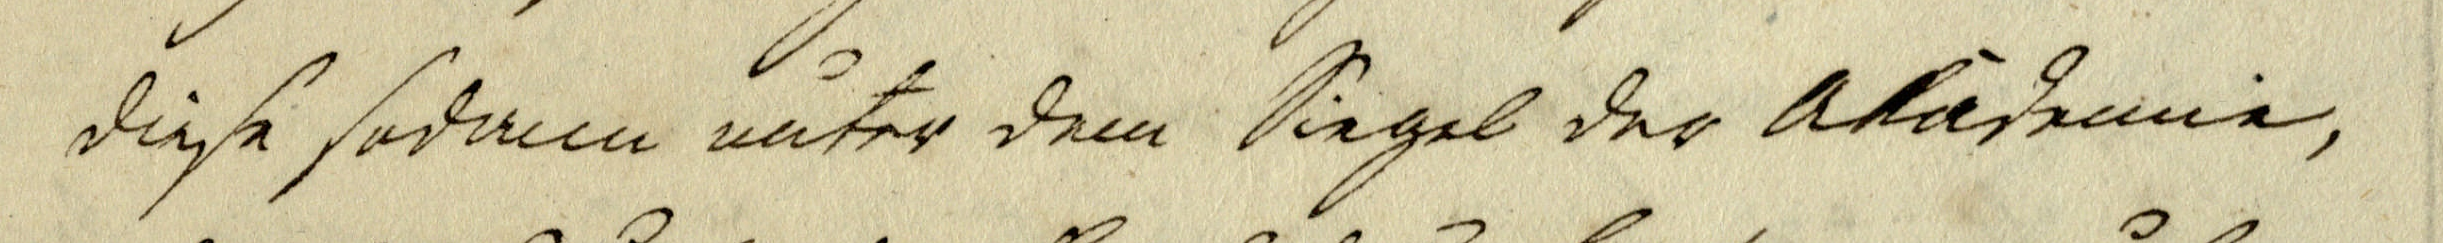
diese sodann unter dem Siegel der Akademie
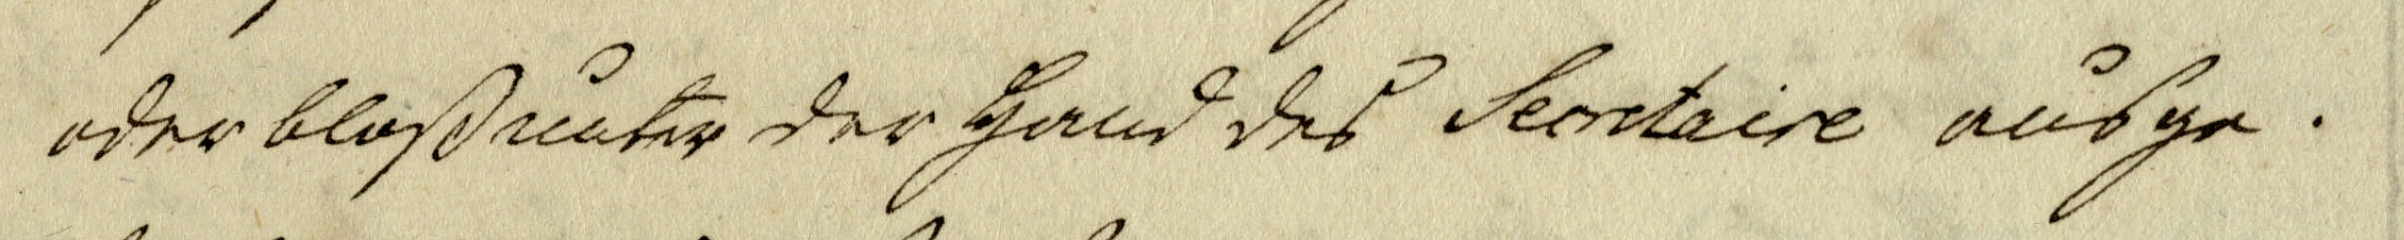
oder blos unter der Hand des Secretaire ausge¬
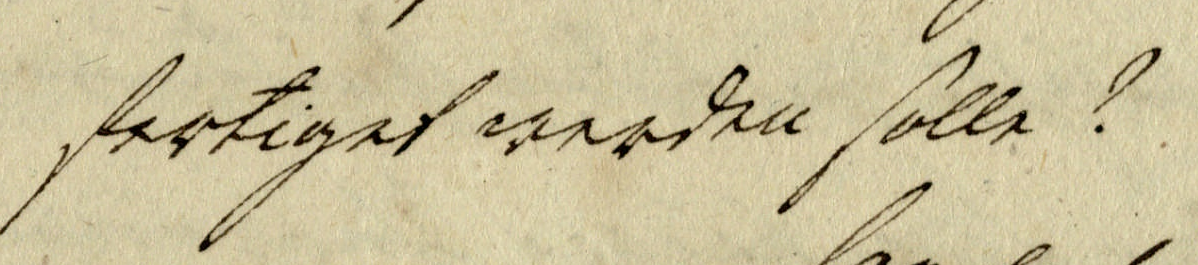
fertiget werden solle?
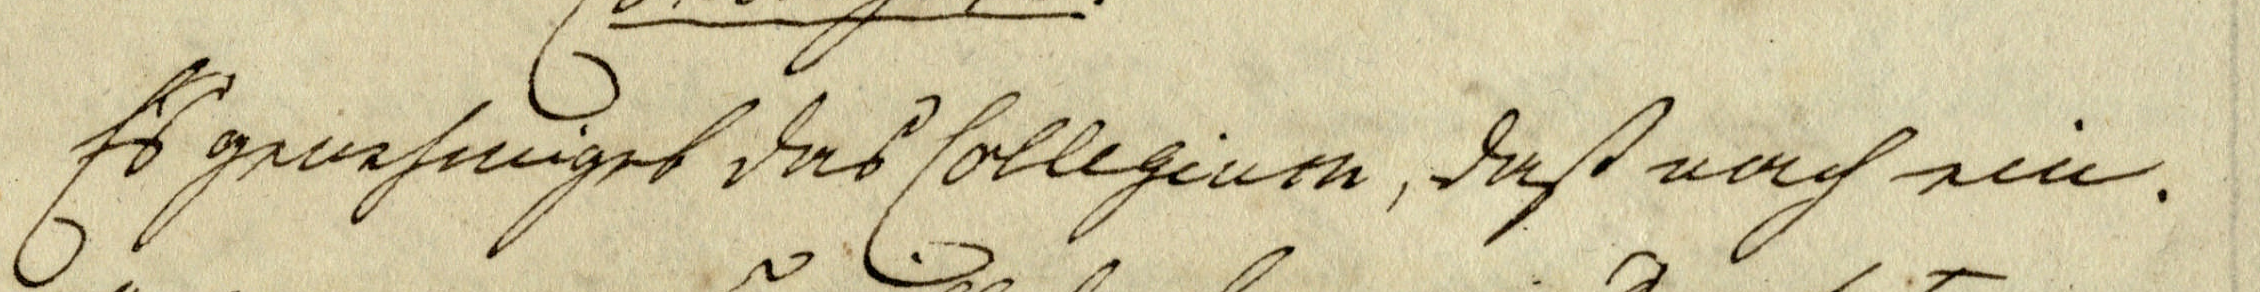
Es genehmiget das Collegium, daß nach ein¬
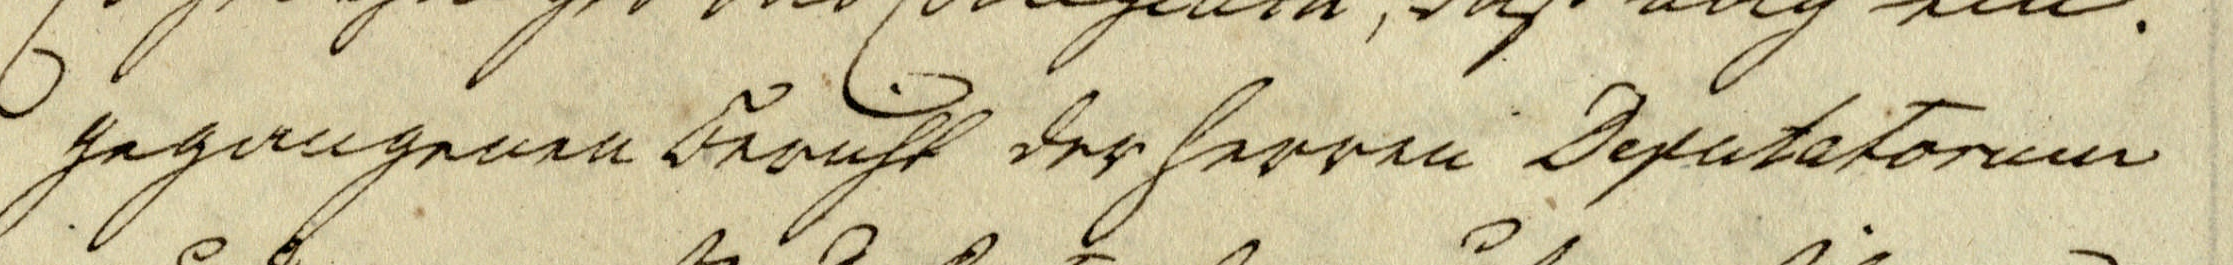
gegangenen Bericht der Herren Deputatorum
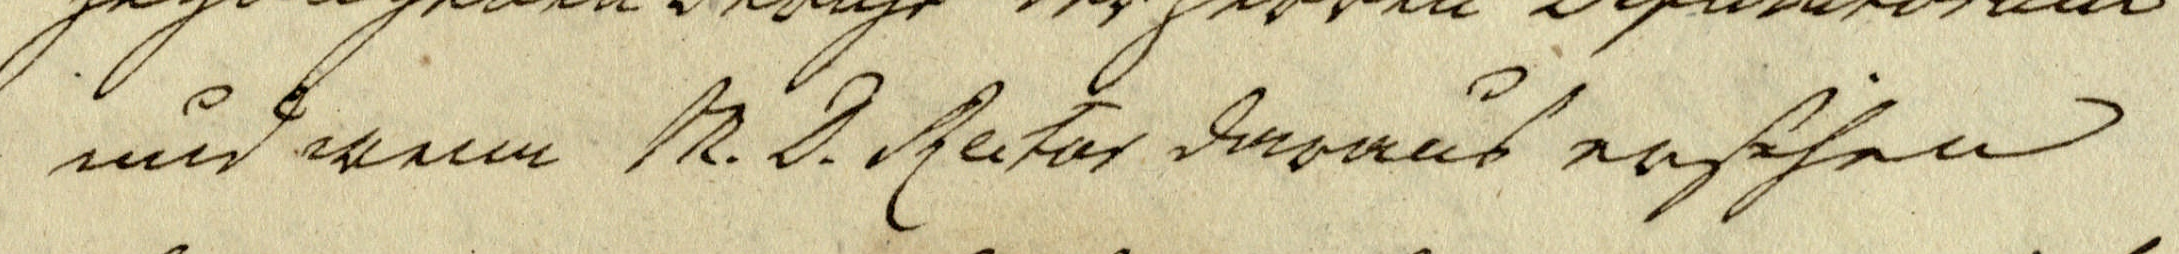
und wenn M. D. Rector daraus ersehen
